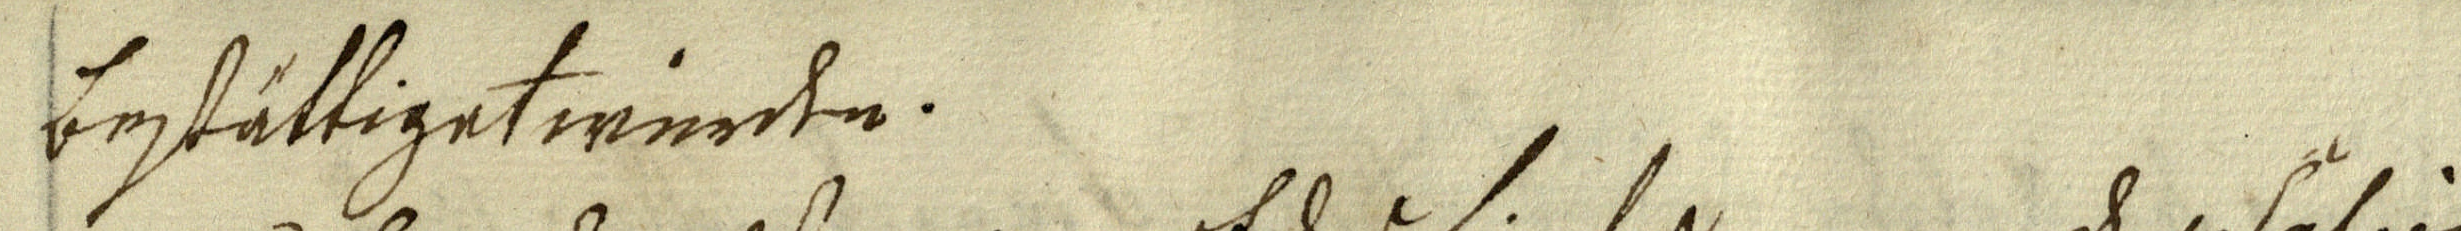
bestättiget würden.
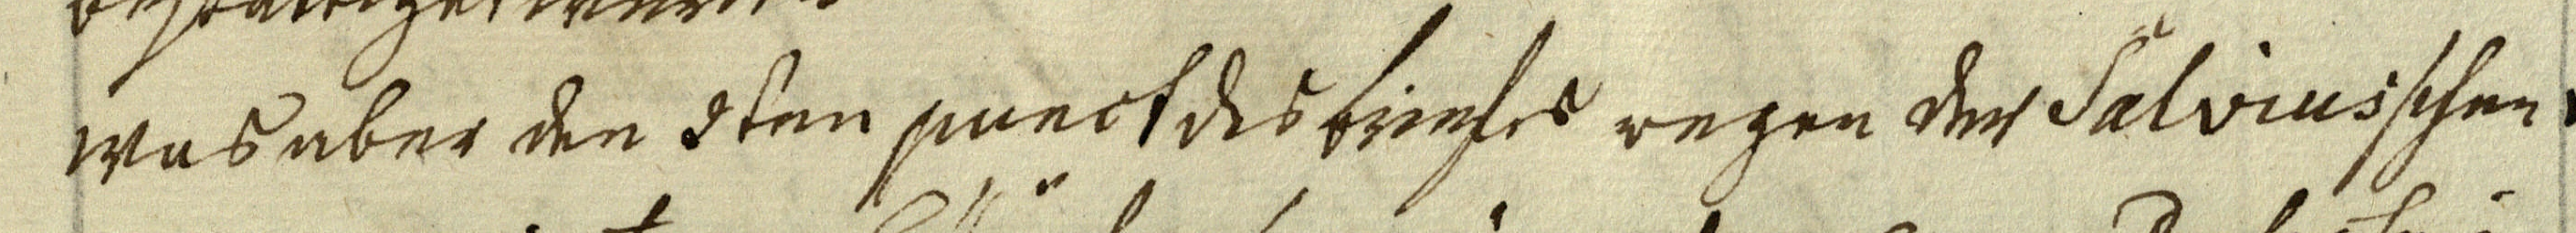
was aber den 2 ten punct des Briefes wegen der Salviusschen
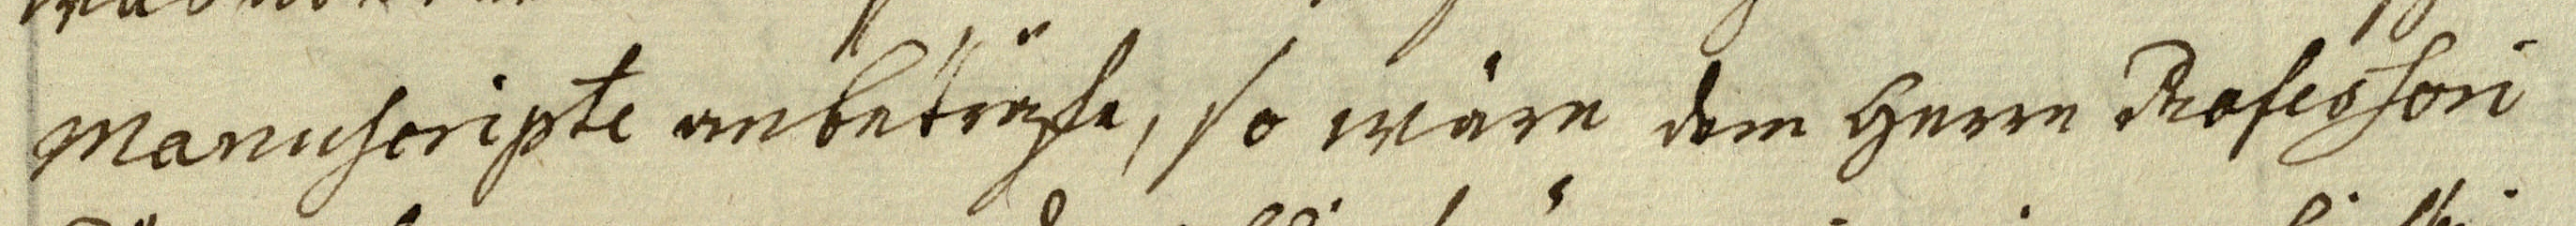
Manuscripte anbeträfe, so wäre dem Herrn Professori
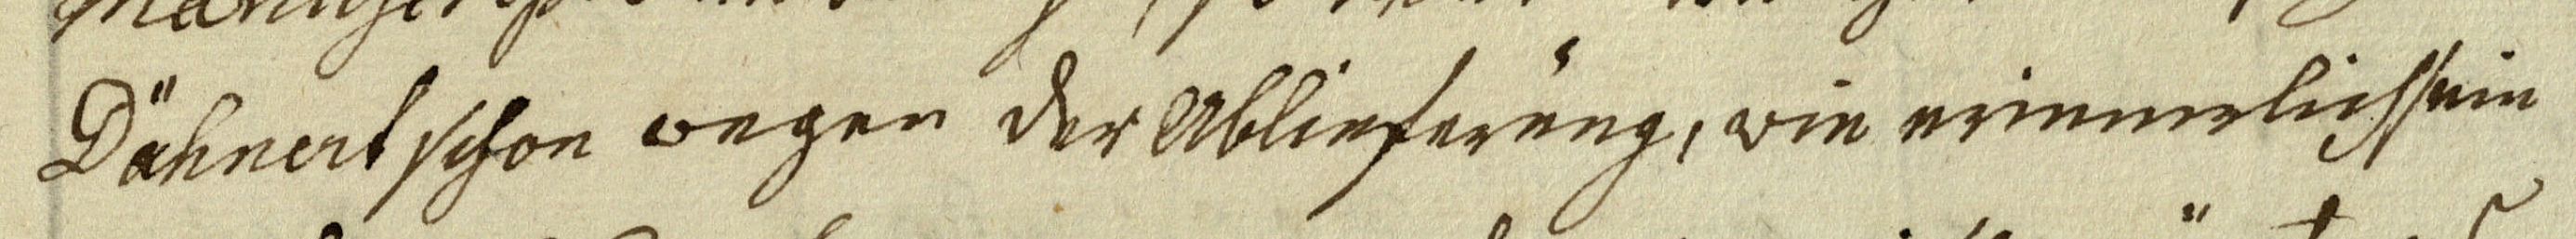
Dähnert schon wegen der Ablieferung, wie erinnerlich sein
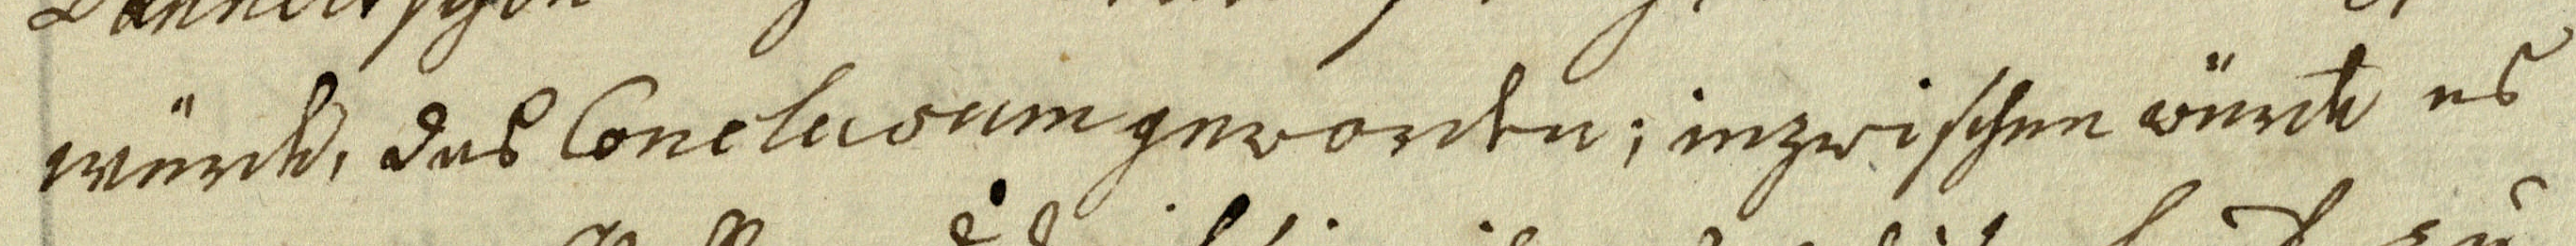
würde, das Conclusum geworden; inzwischen würde es
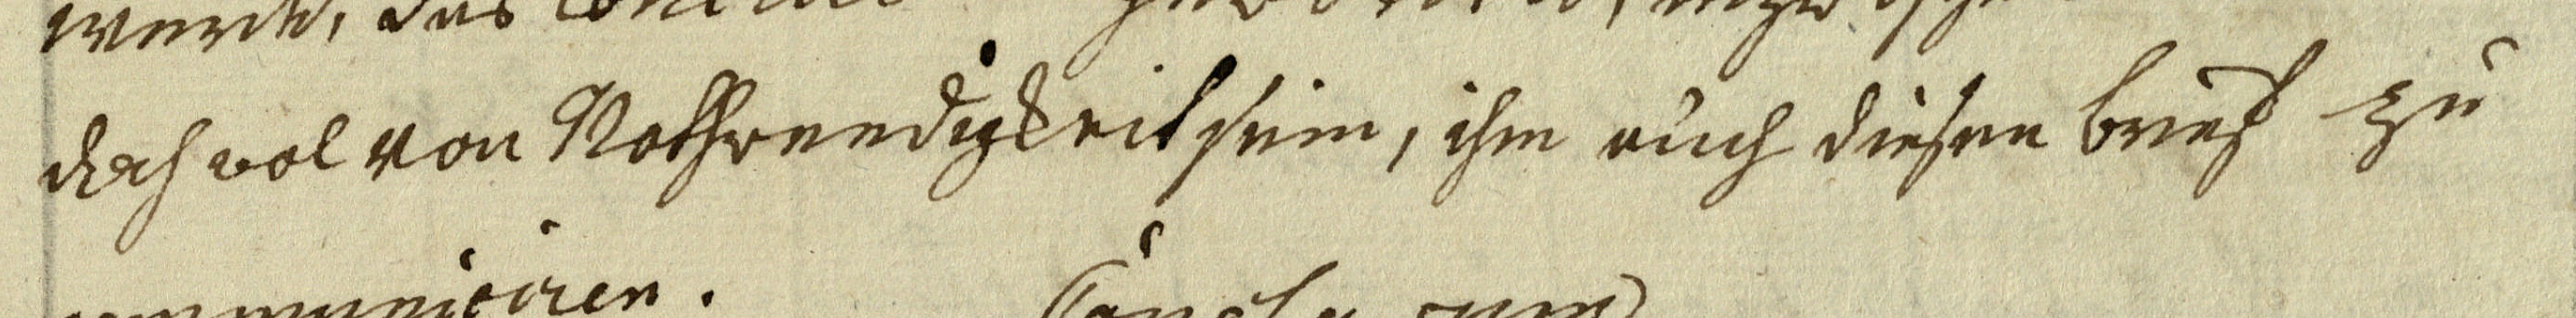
doch wol von Nothendigkeit sein, ihm auch diesen Brief zu
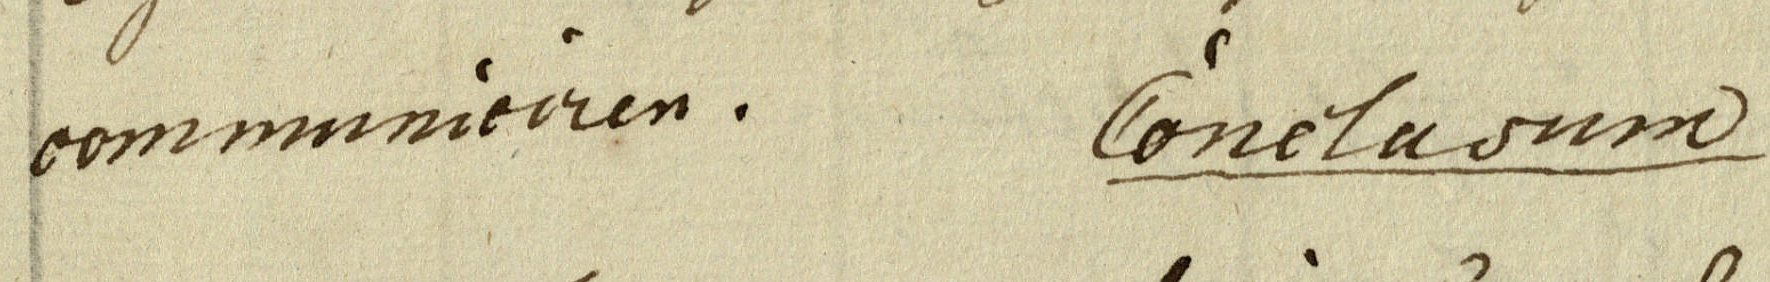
communiciren.
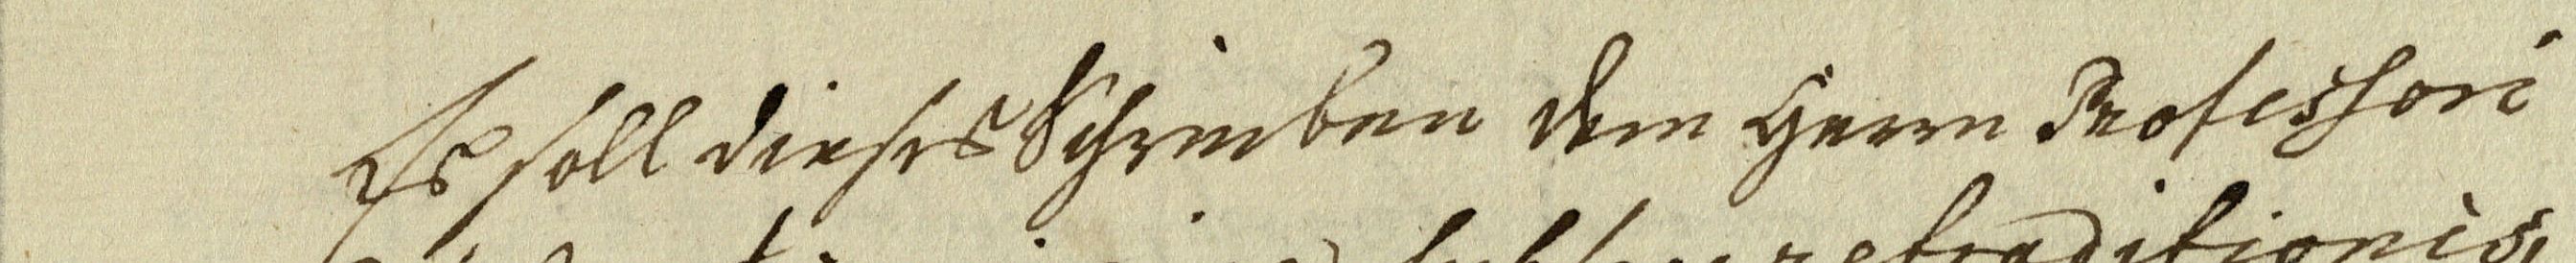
Es soll dieses Schreiben dem Herrn Professori
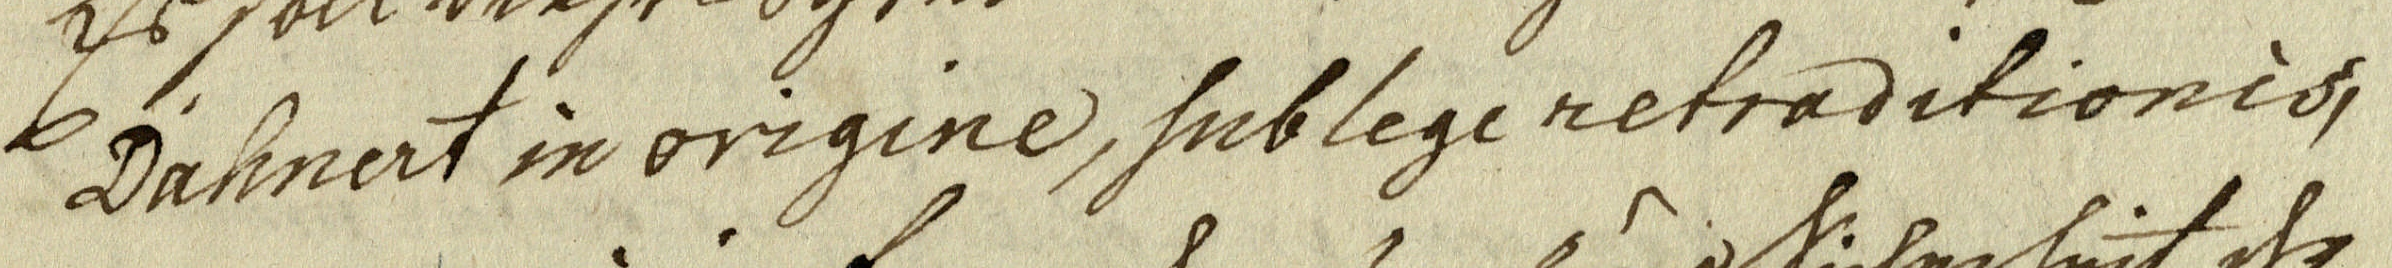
Dähnert in orgine, sub lege retraditionis,
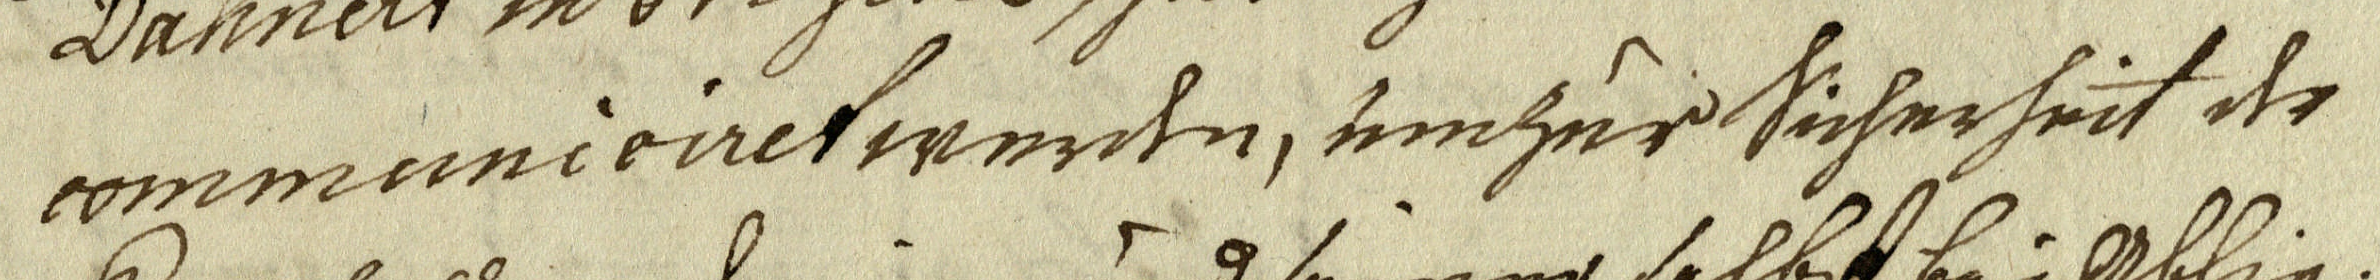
communiciret werden, um zur Sicherheit der
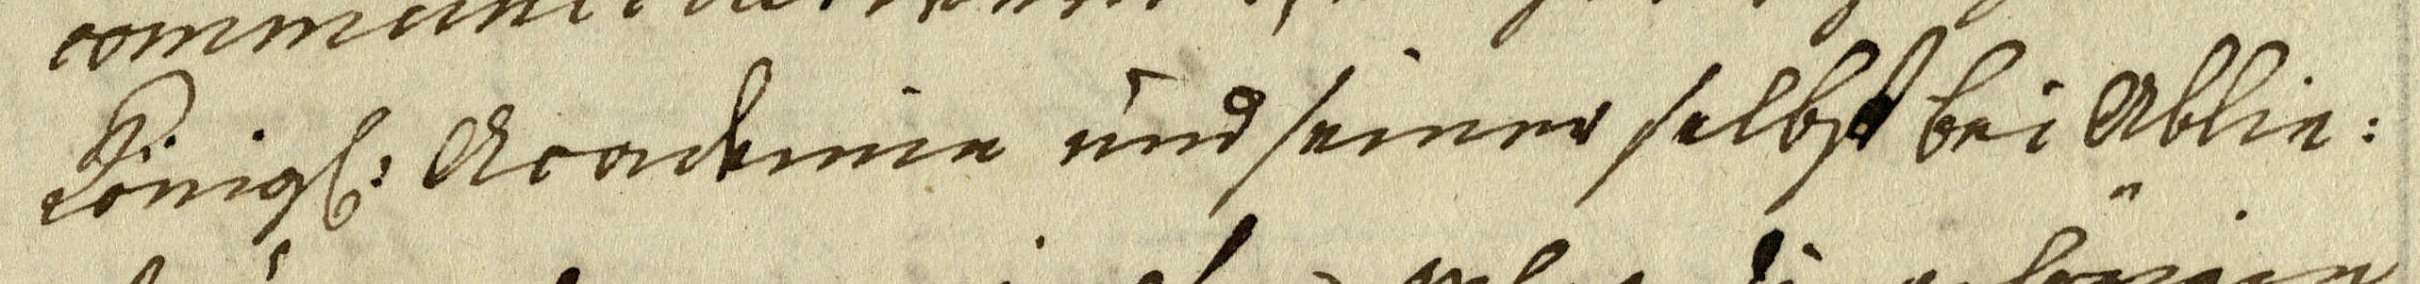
Königl. Academie und seiner selbst bei Ablie¬
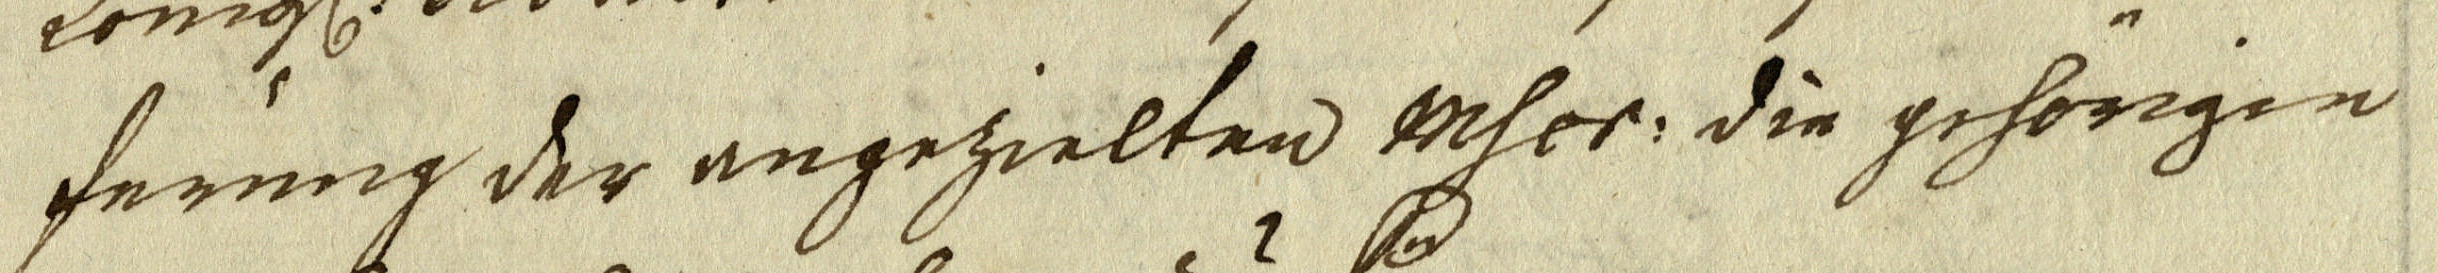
ferung der angezielten Mscr. die gehörigen
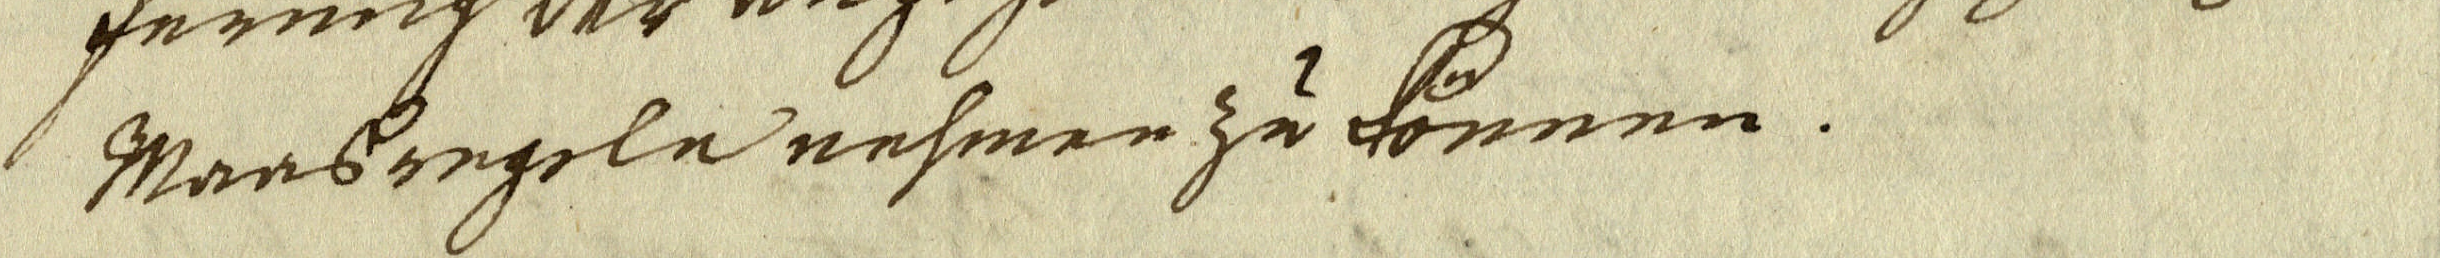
Maasregeln nehmen zu können.
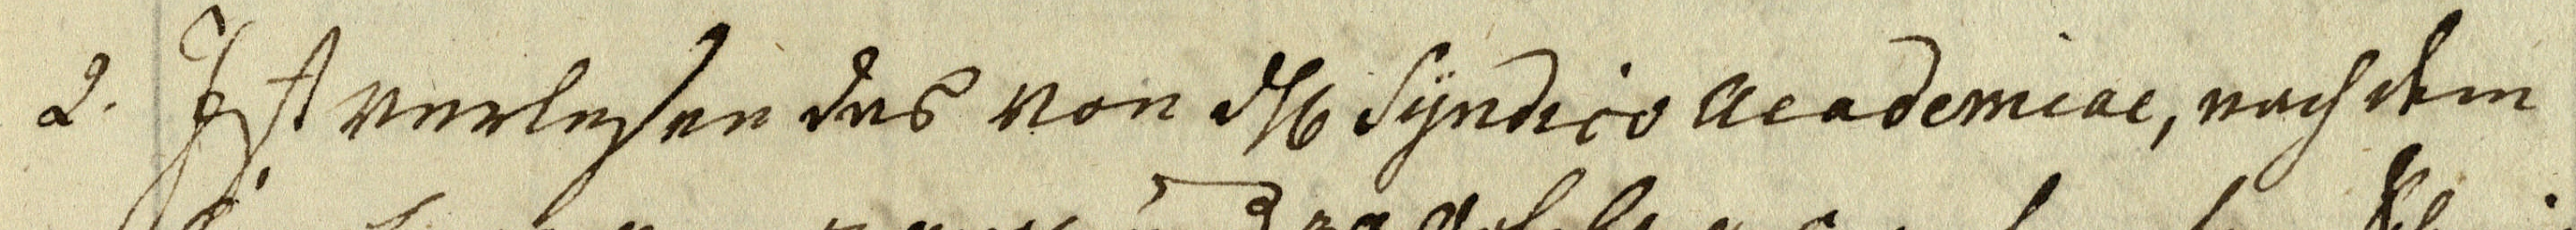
2. Ist verlesen das von dh. Sÿndico Academiae, nach dem
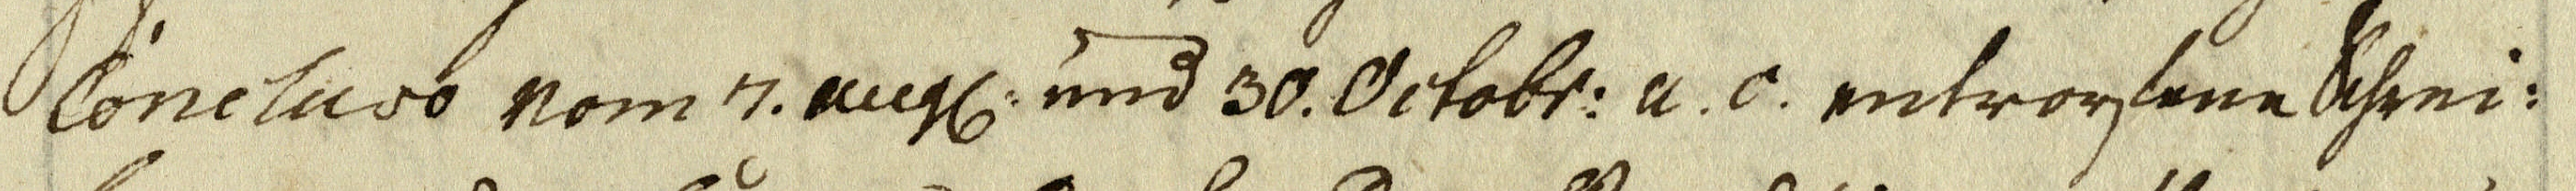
Concluso vom 7. Aug. und 30. Octobr. a. c. entworfene Schrei¬
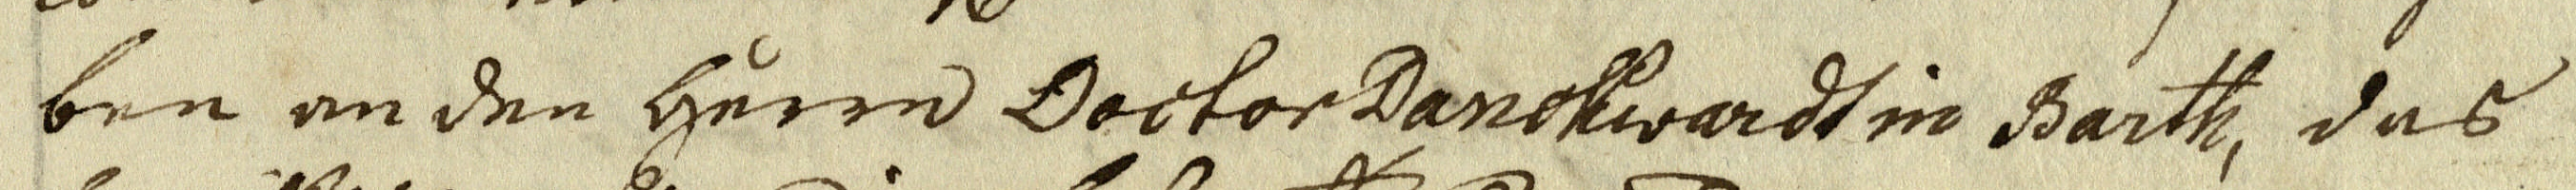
ben an den Herrn Doctor Danckwardt in Barth, das
